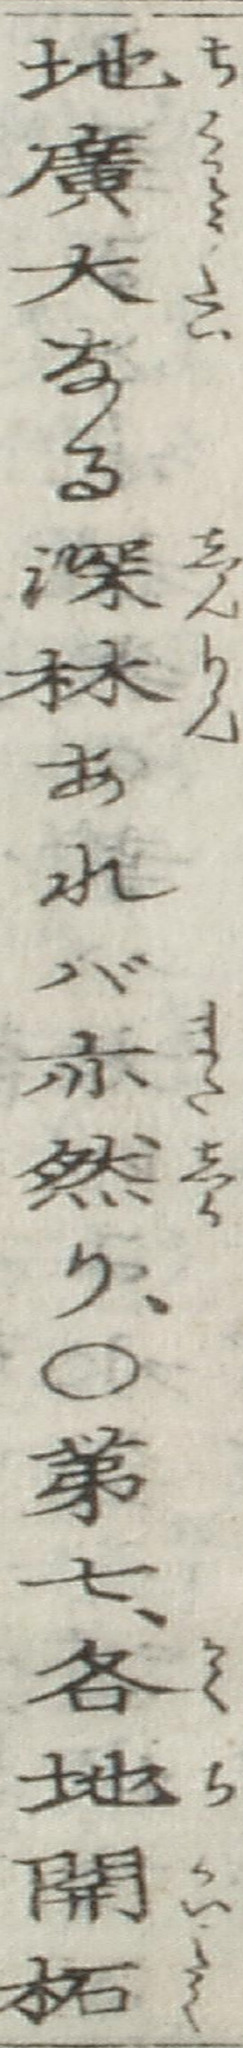地広大なる深林あれば亦然り、○第七、各地開拓
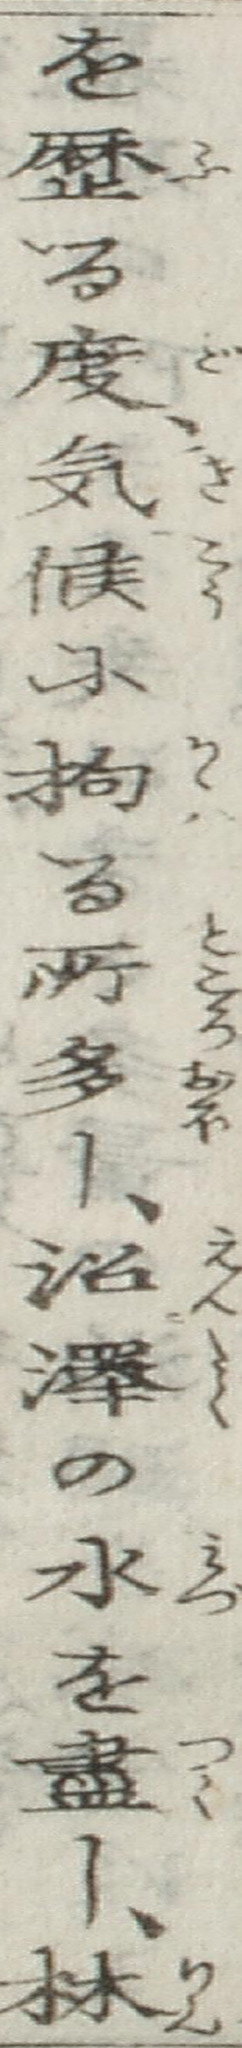を歴る度、気候に拘る所多し、沿沢の水を尽し、林
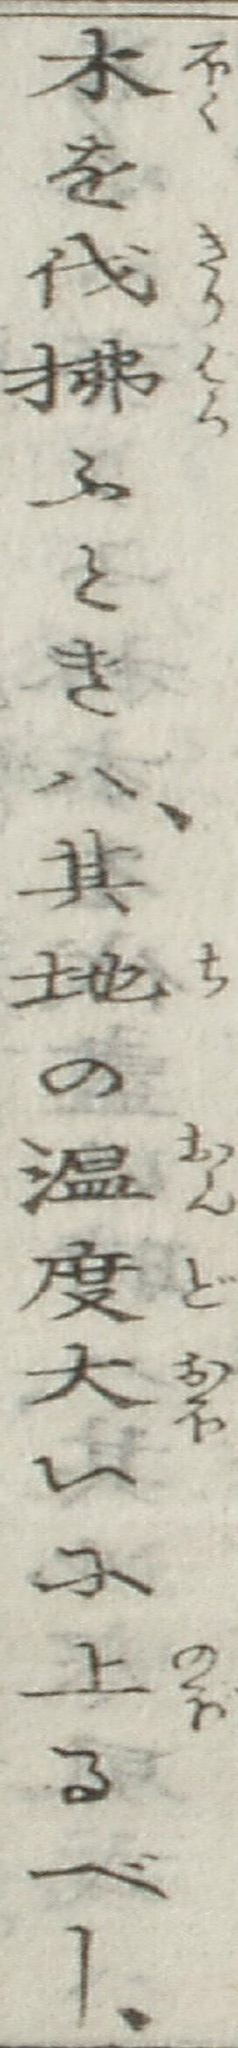木を伐払ふときは、其地の温度大いに上るべし、
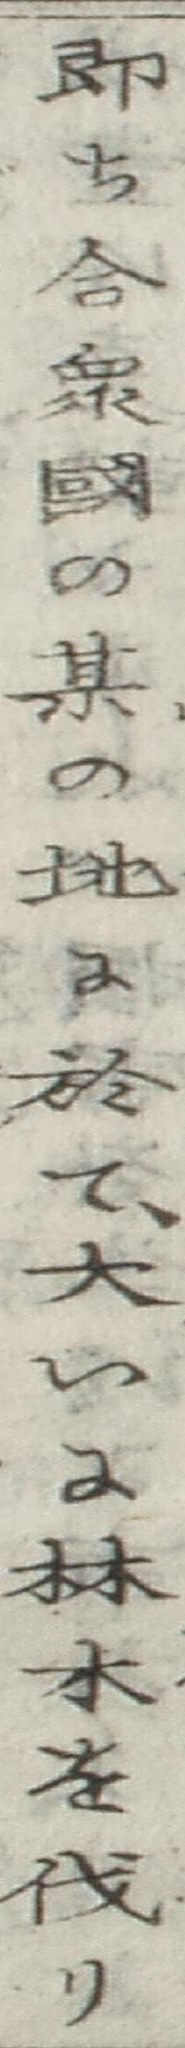即ち合衆国の其の地に於て、大いに林木を伐り
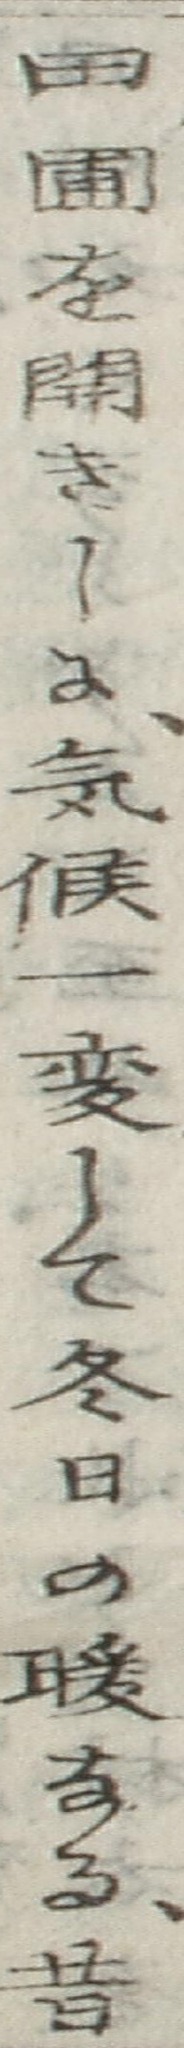田圃を開きしに、気候一変して冬日の暖なる、昔

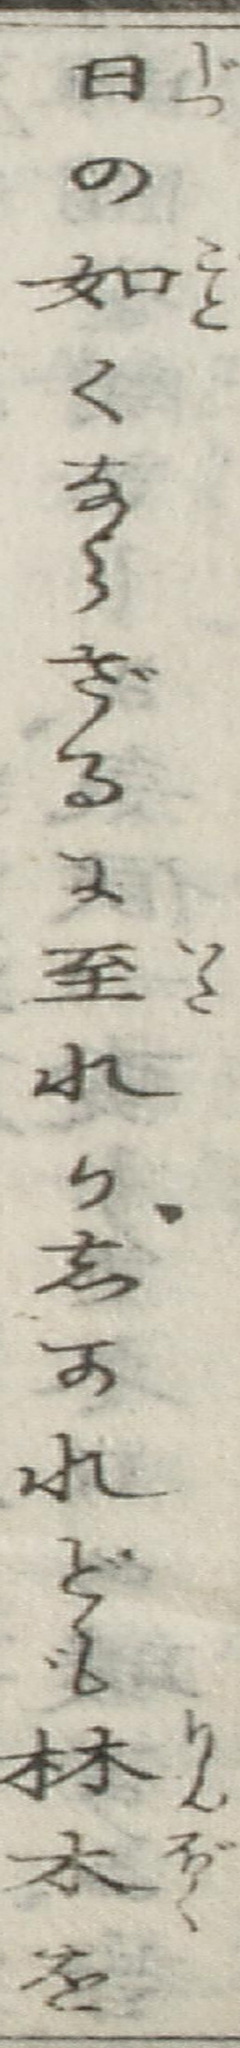日の如くならざるに至れり、しかれども林木を
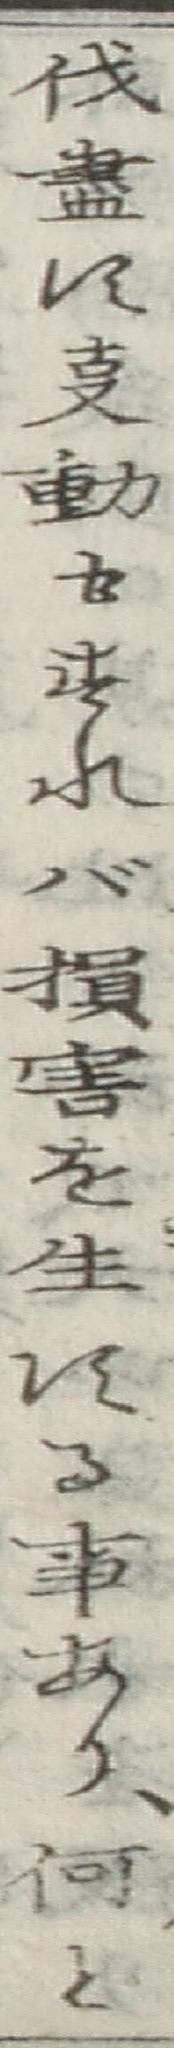伐盡す事、動もすれば損害を生する事あり、何と
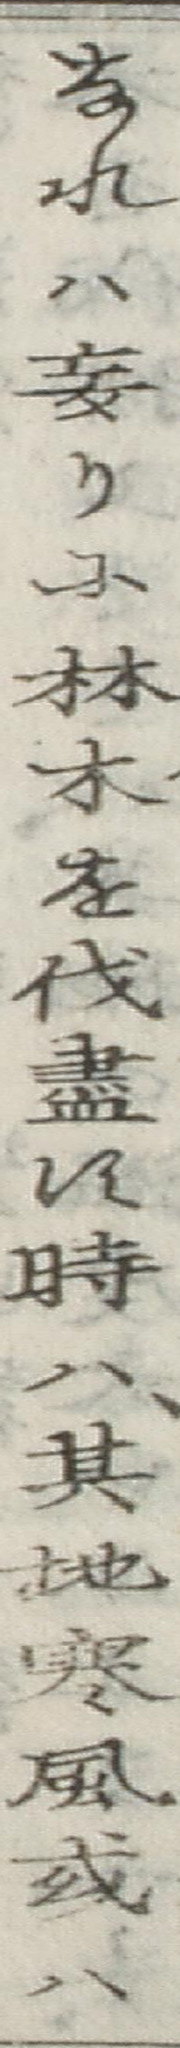なれは妄りに林木を伐盡す時は、其の地寒風或は
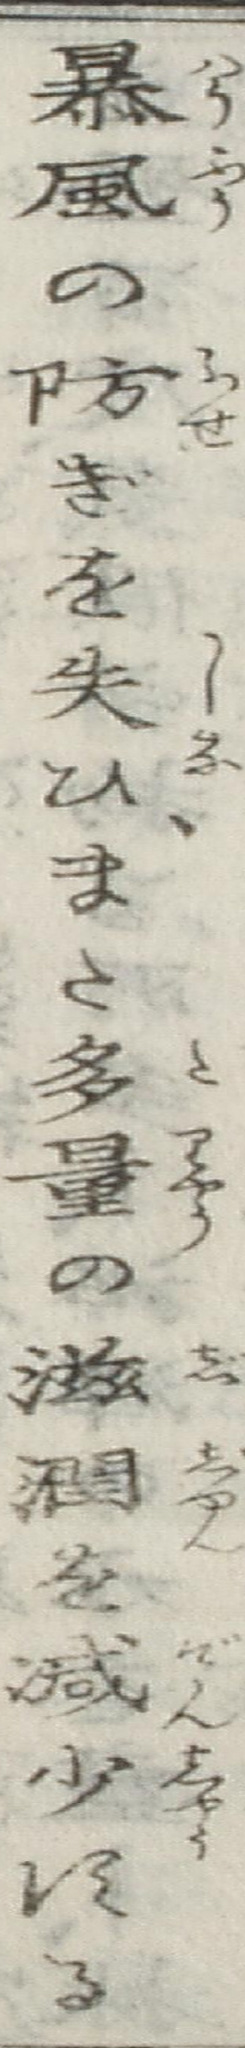暴風の防ぎを失ひ、また多量の滋潤を減少する
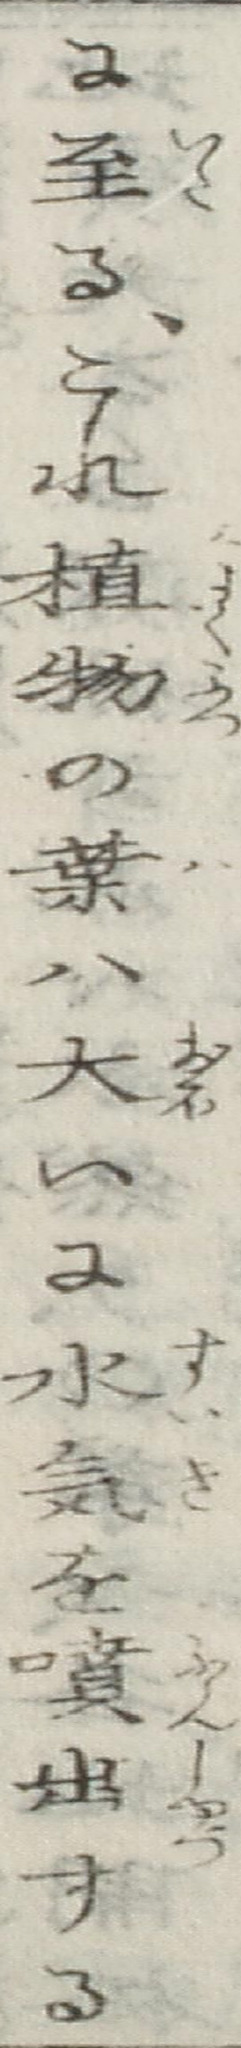に至る、これ植物の葉は大いに水気を噴出する
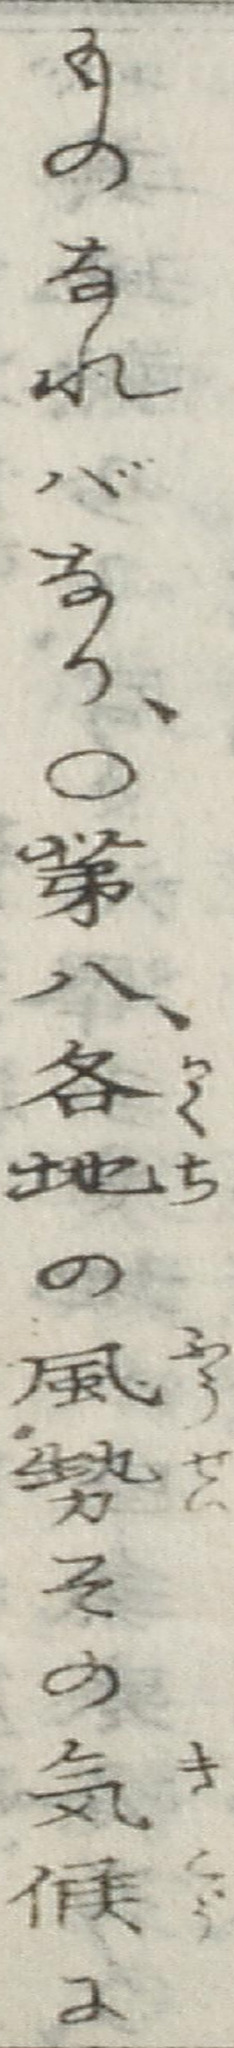ものなればなり、〇第八、各地の風勢その気候に
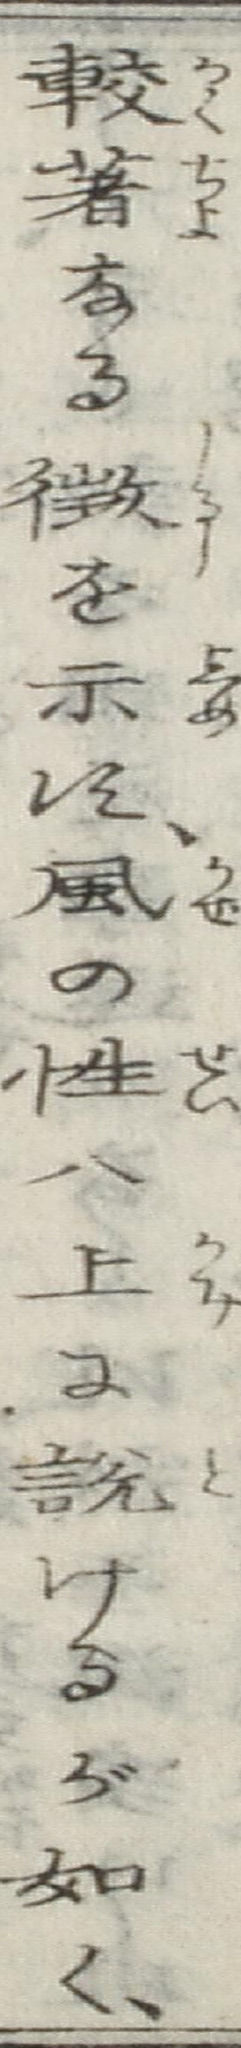較著なる徴を示す、風の性は上に説けるが如く、
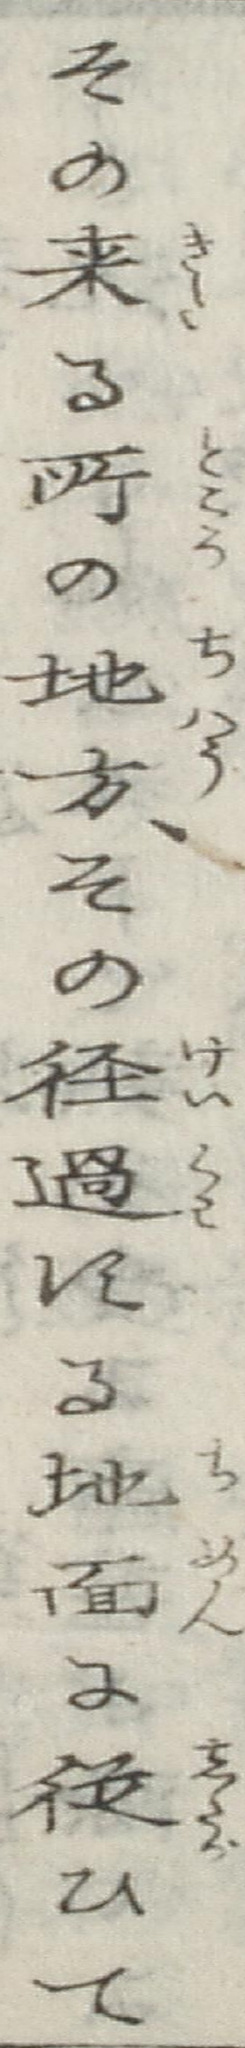その来る所の地方、その経過する地面に従ひて
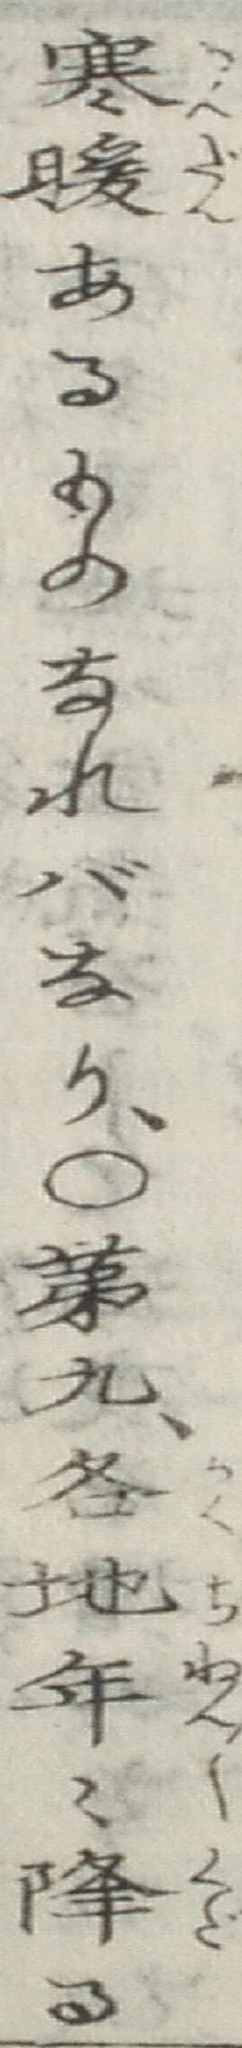寒暖あるものなればなり、〇第九、各地年ゝ降る
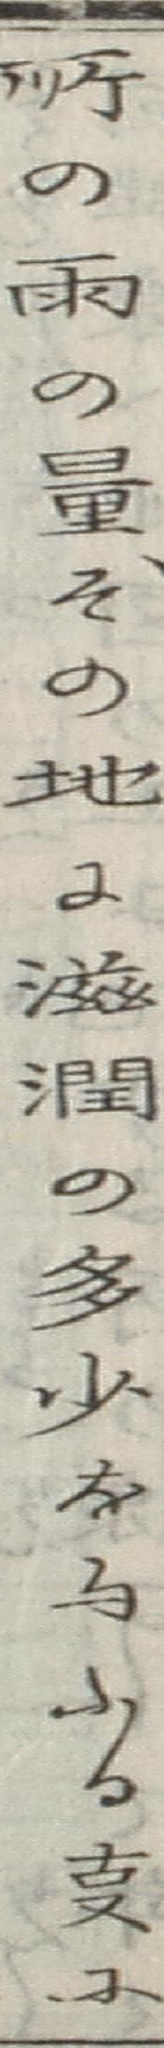所の雨の量、その地に滋潤の多少を与ふる事に
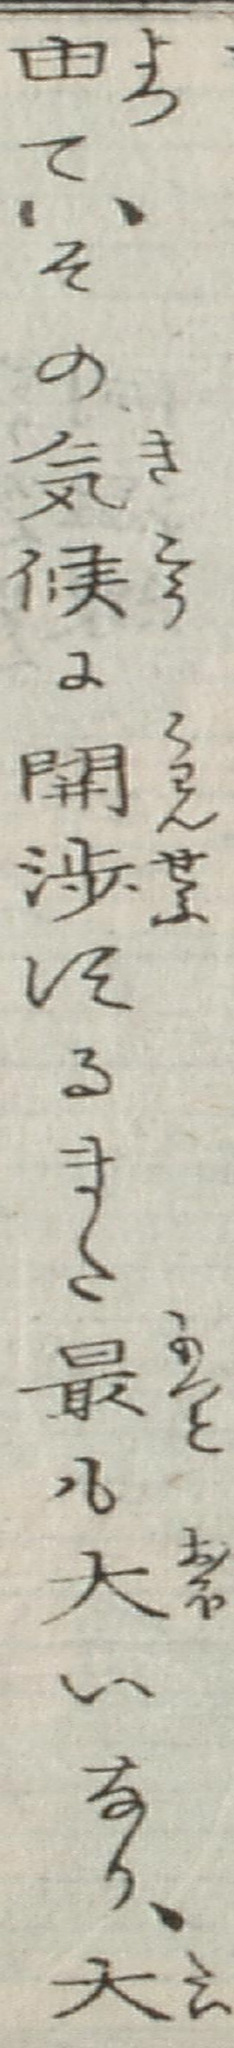由て、その気候に関渉するまた最も大いなり、大
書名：訓蒙　天然地理學　下
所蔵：東京大学地震研究所図書室 Earthquake Research Institute Library, The University of Tokyo, JAPAN
